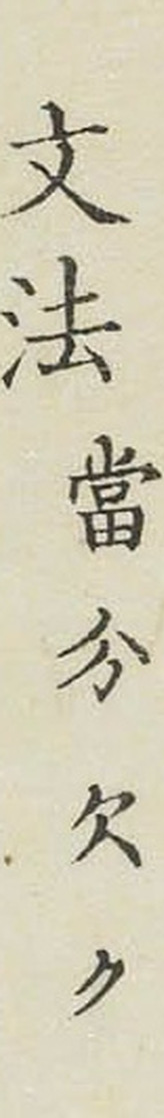文法当分欠ク
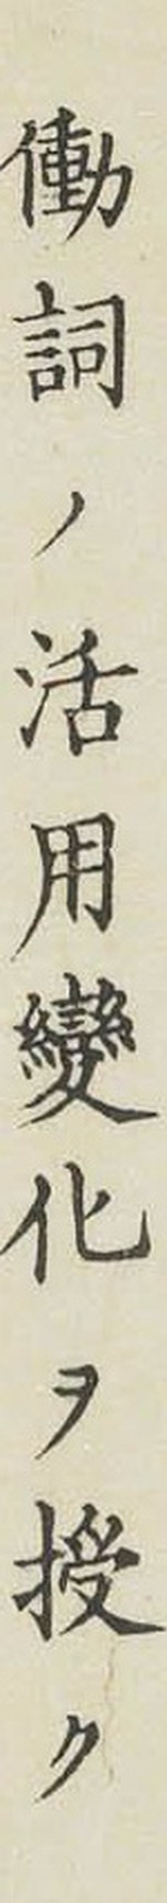働詞ノ活用変化ヲ授ク
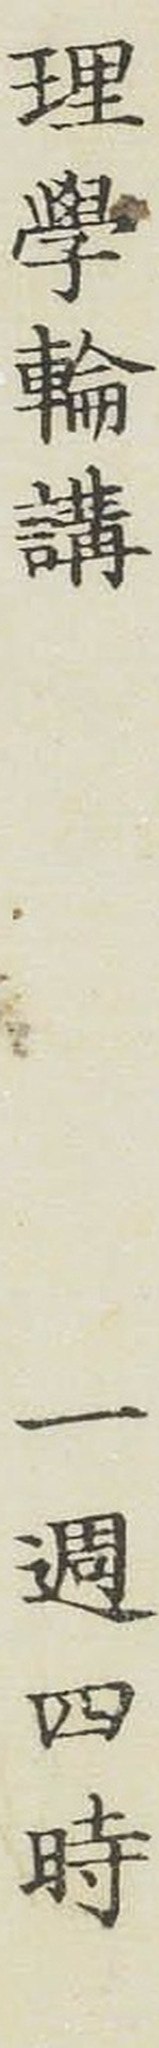理学輪講一週四時
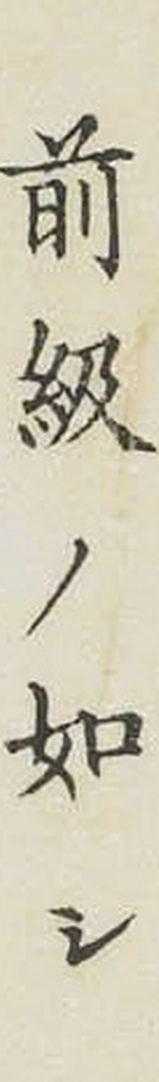前級ノ如シ
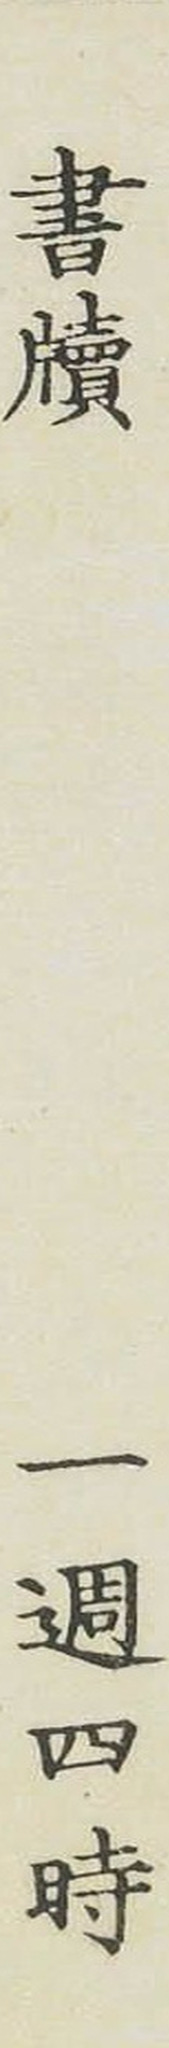書牘一週四時
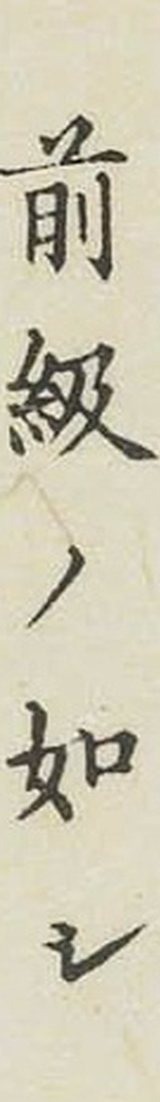前級ノ如シ
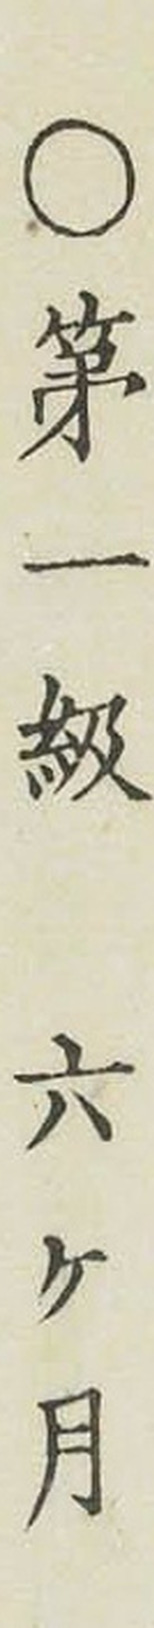○第一級六ケ月
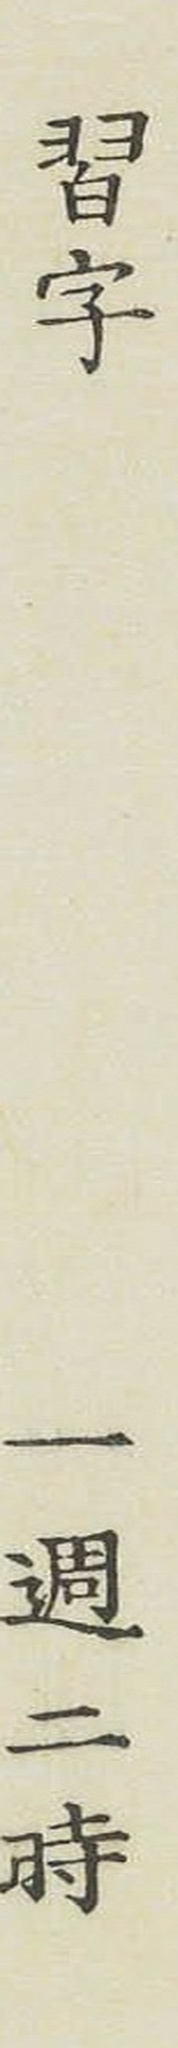習字一週二時
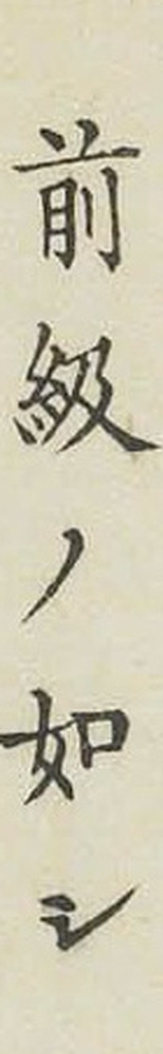前級ノ如シ
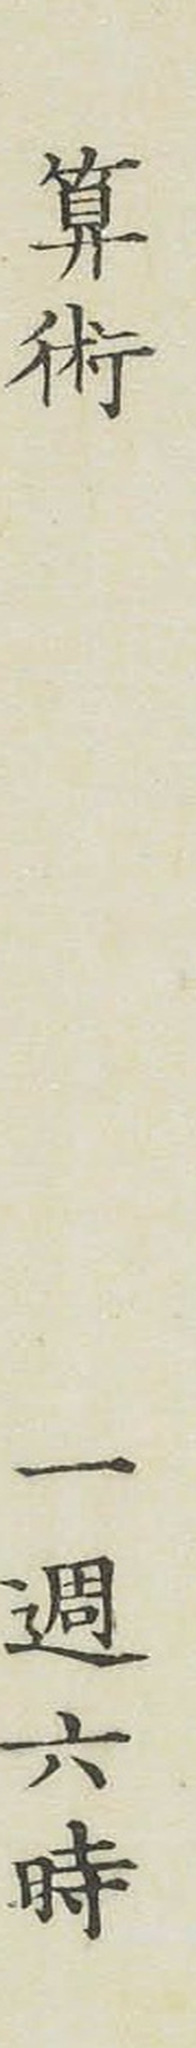算術一週六時
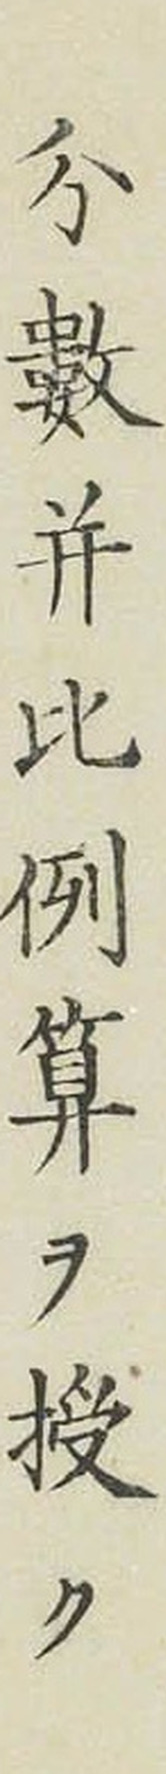分数并比例算ヲ授ク
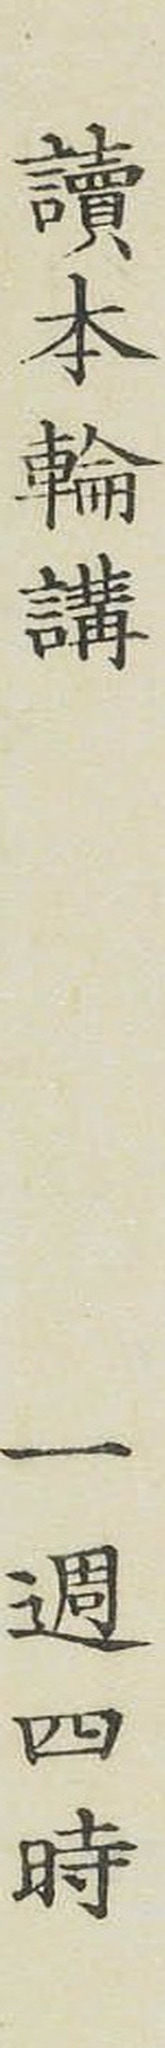読本輪講一週四時
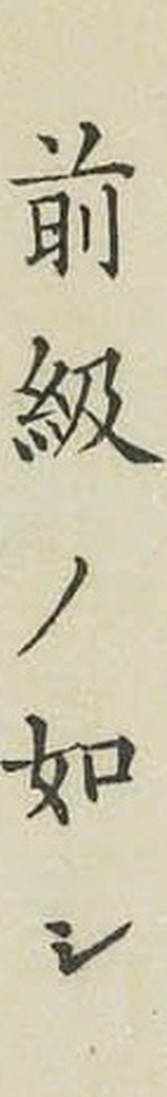前級ノ如シ
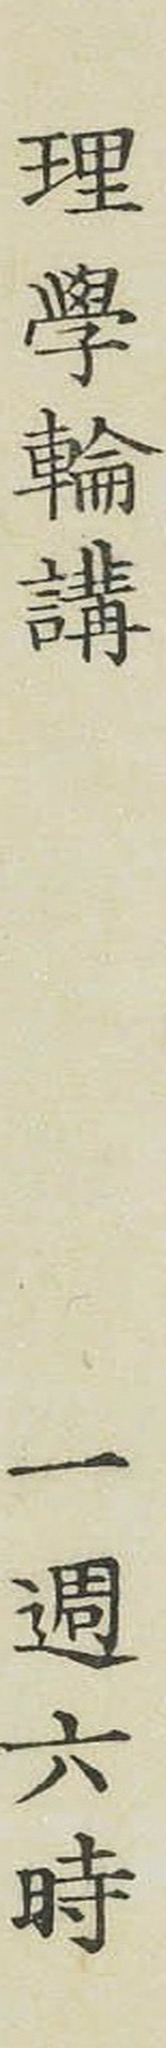理学輪講一週六時
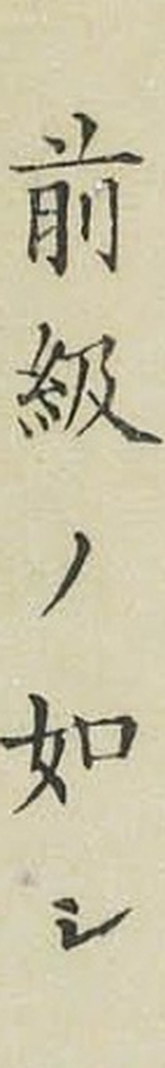前級ノ如シ

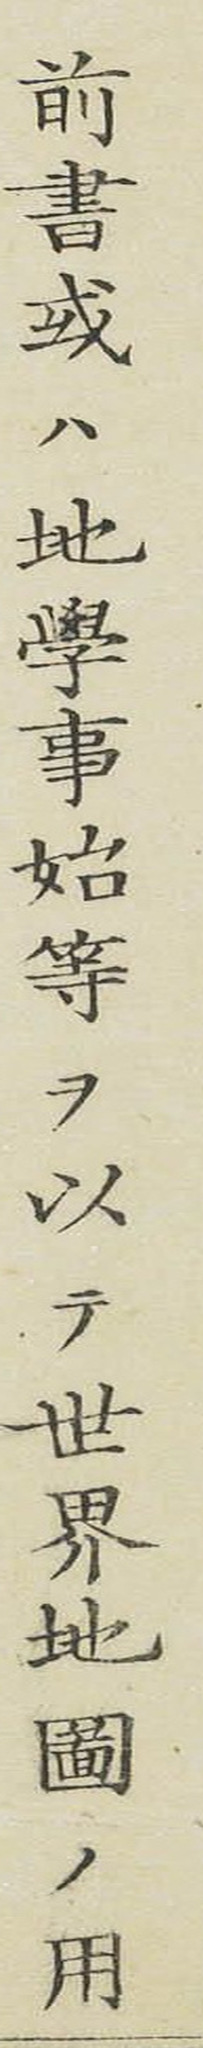前書或ハ地学事始等ヲ以テ世界地図ノ用
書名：小学教則
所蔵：東京学芸大学教育コンテンツアーカイブ
